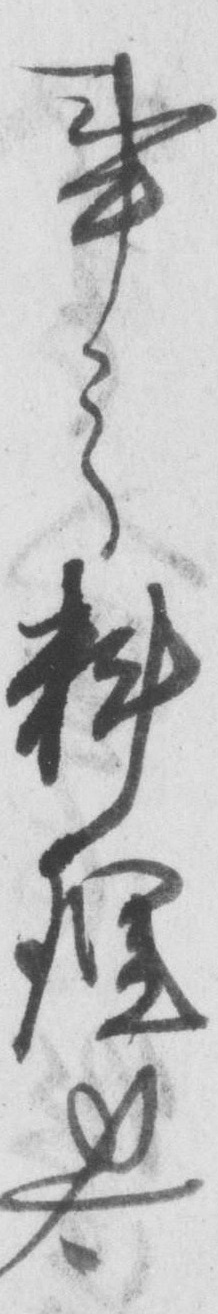事之料理也
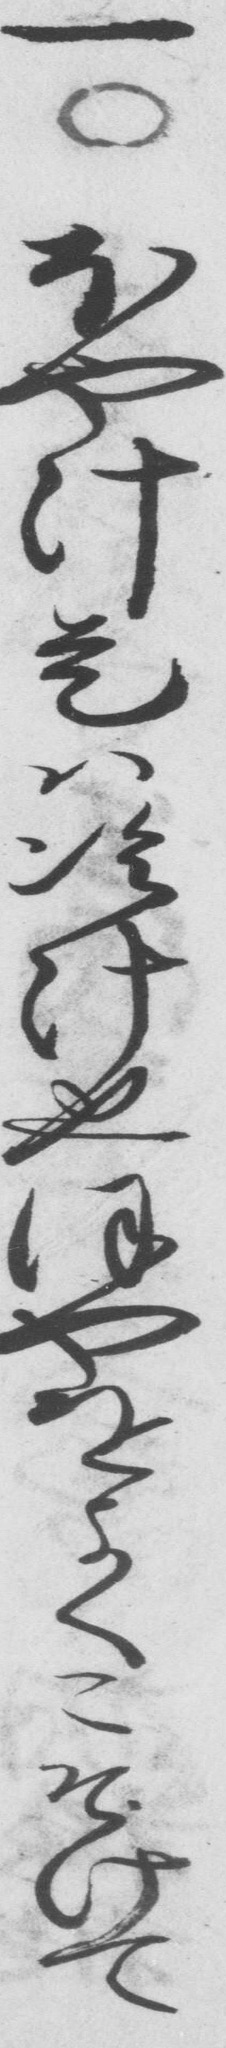一○ほや汁是は冷汁也ほやをよくこそけて
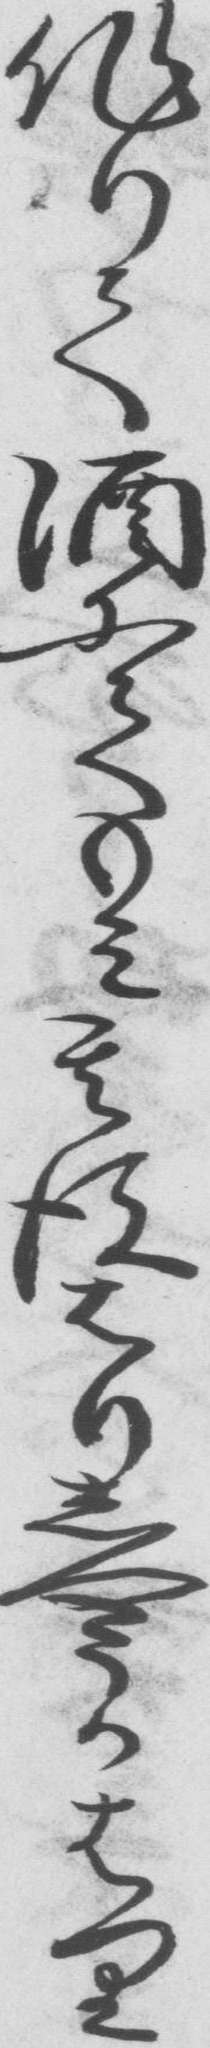作りて酒にてもみ其後はりしやうかはり
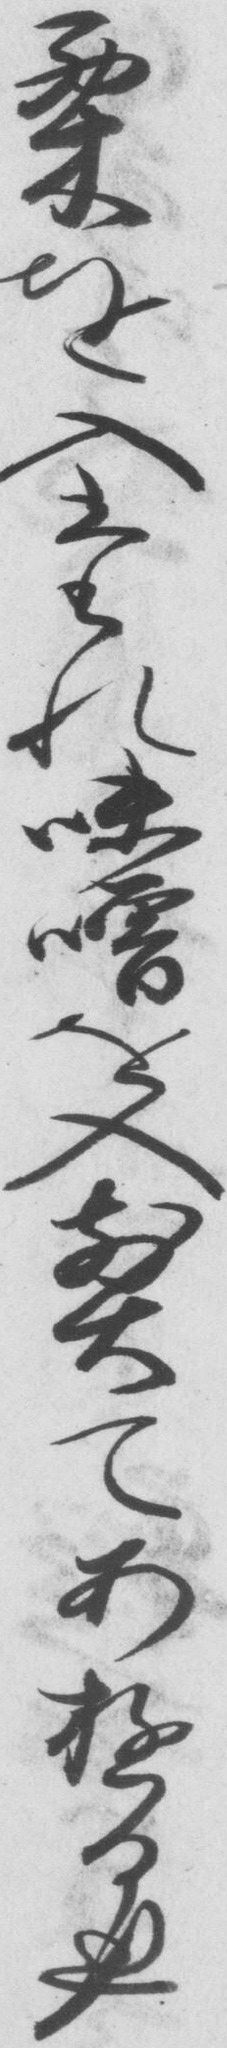栗を入たれ味噌を入煮てあゆる也
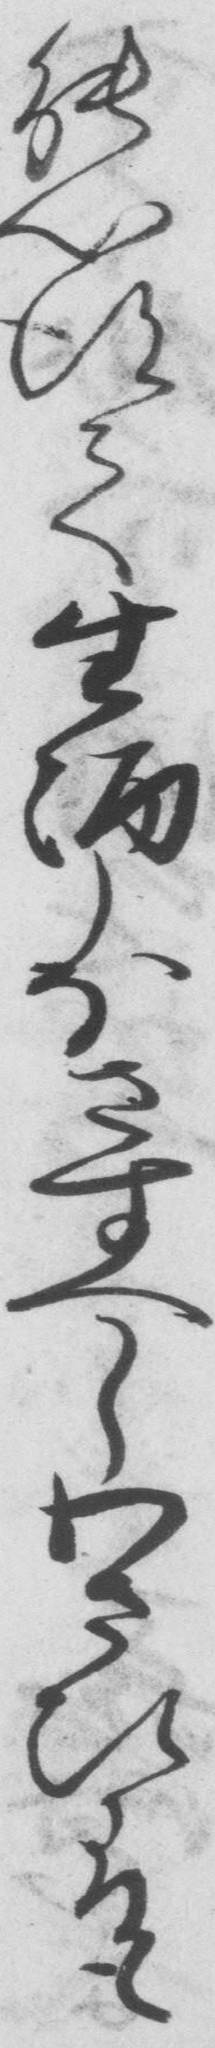能心得て生酒しほさすへしわさひにても
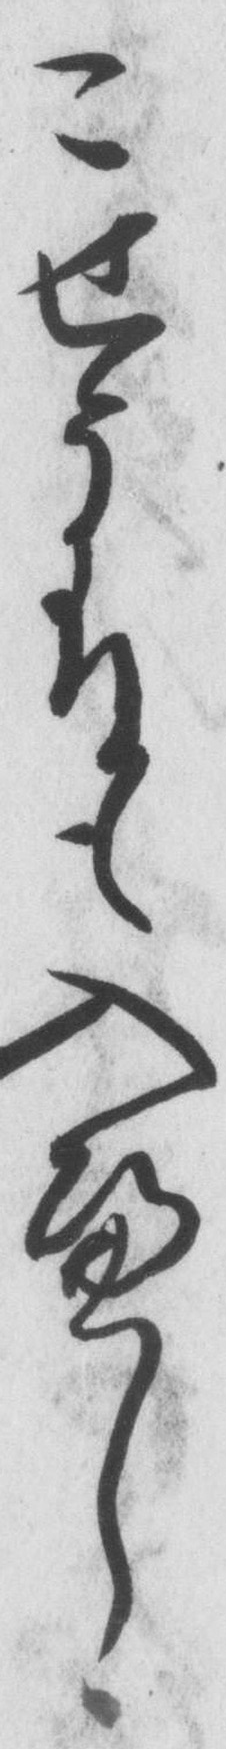こせうにても入へし
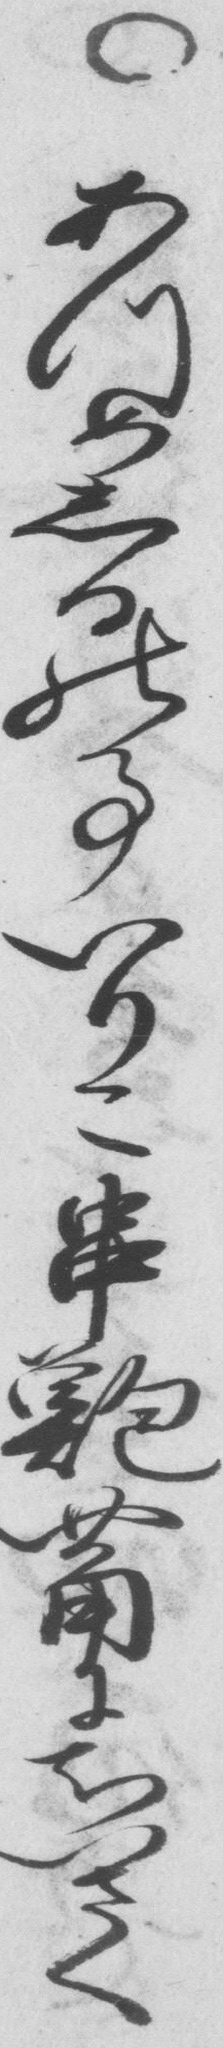一○あつめしるの事いりこ串鮑四角にちいさく
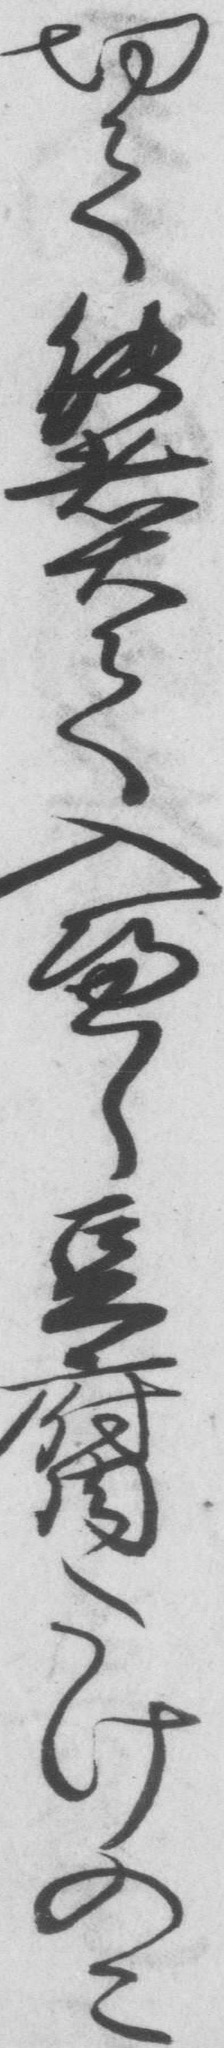切て能煮て入へし豆腐たけのこ
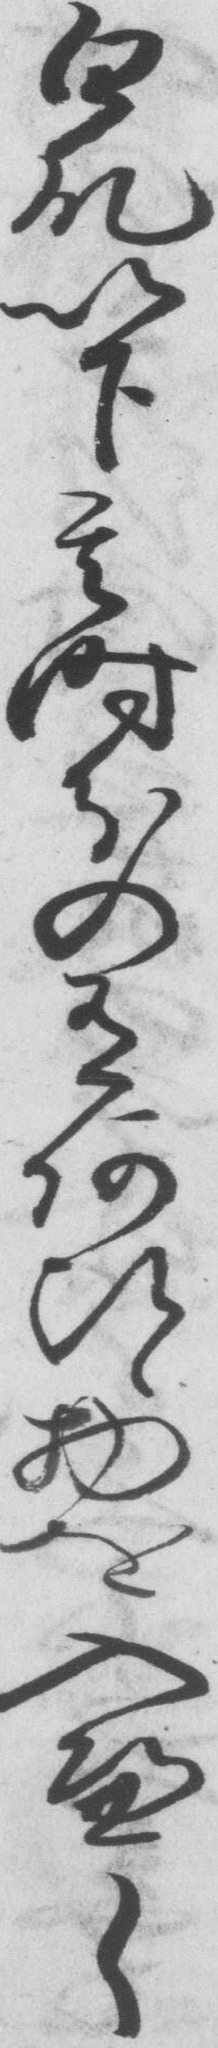白瓜以下其時分の有あひ候物を入へし
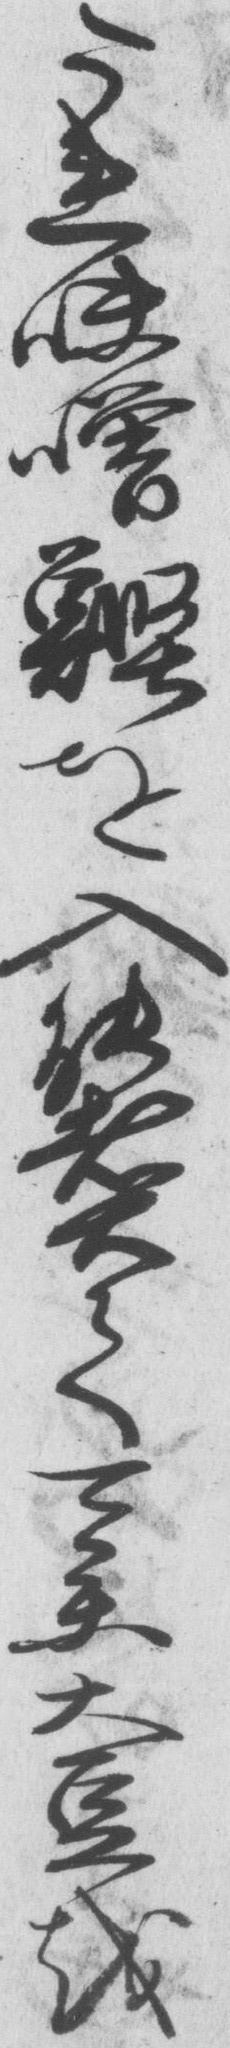たれ味噌鰹を入能煮て可参大豆を
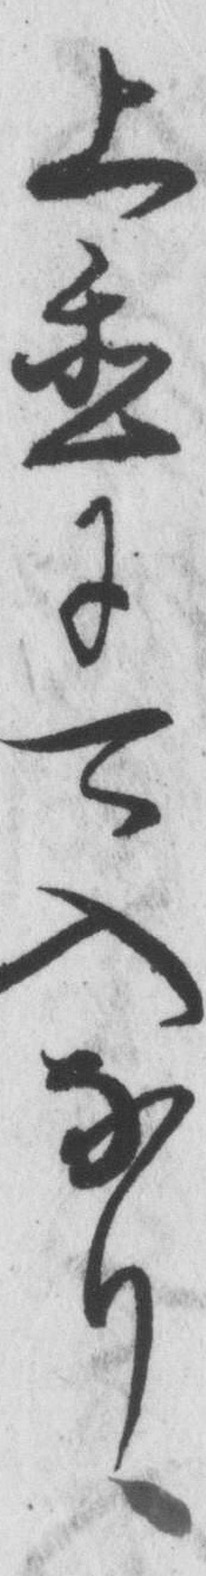上置にて入なり
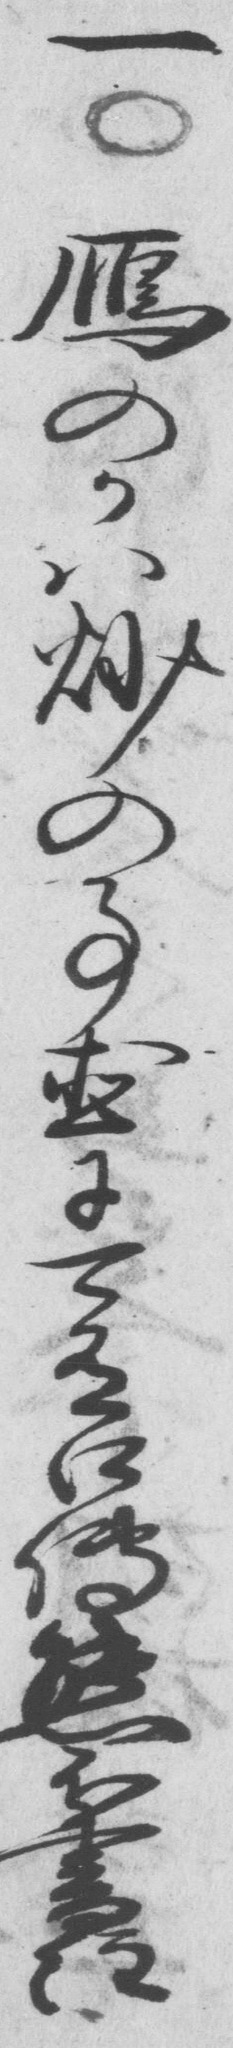一○雁のかは炒の事直に可有口伝態不書注
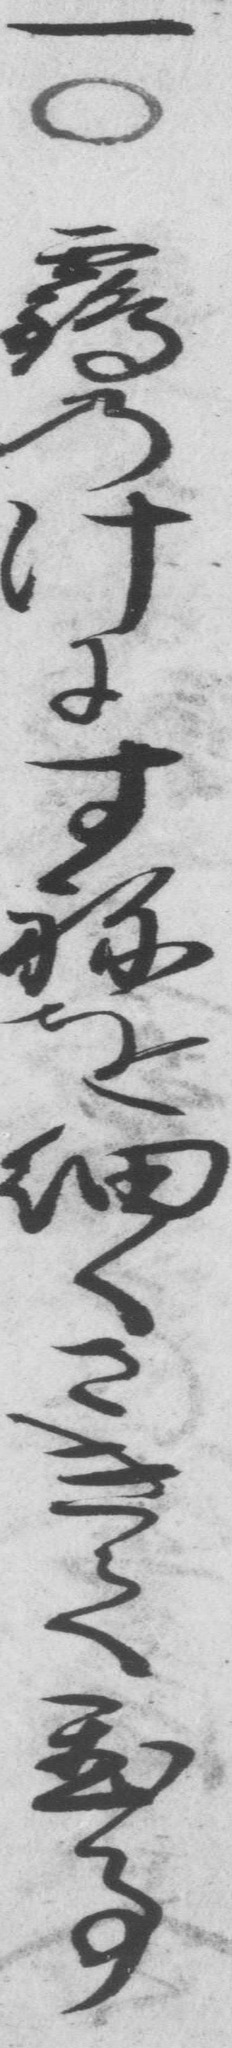一○鶴の汁にすねを細くさきて置事
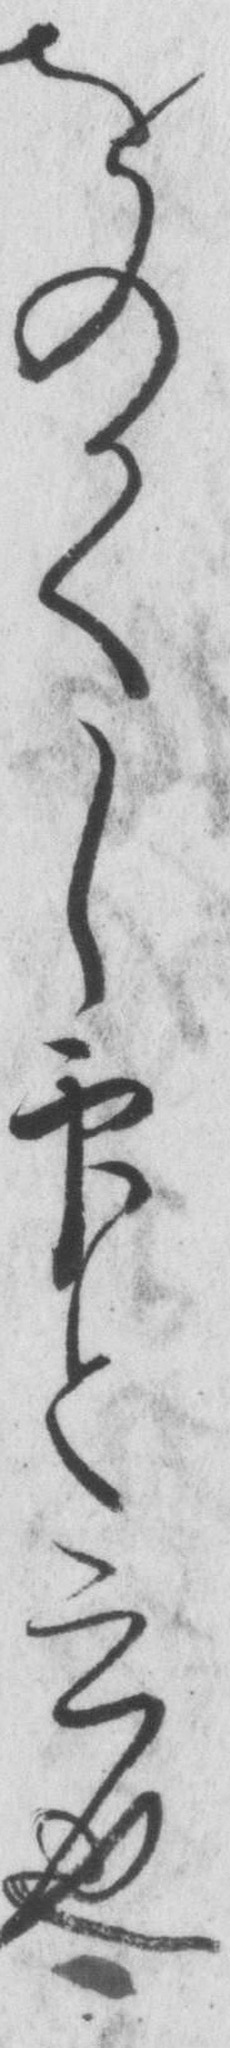をのかへし印と云也
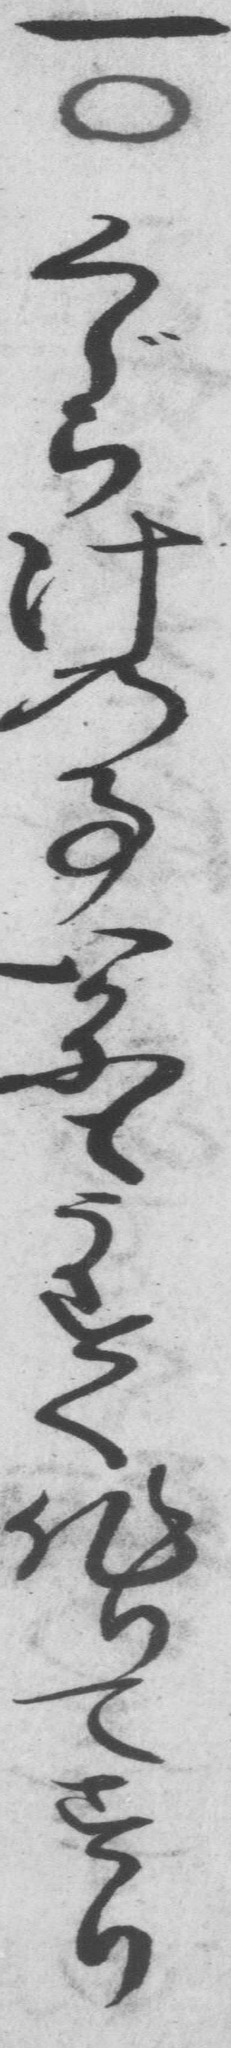一○くじら汁の事いかにもうすく作りてすり
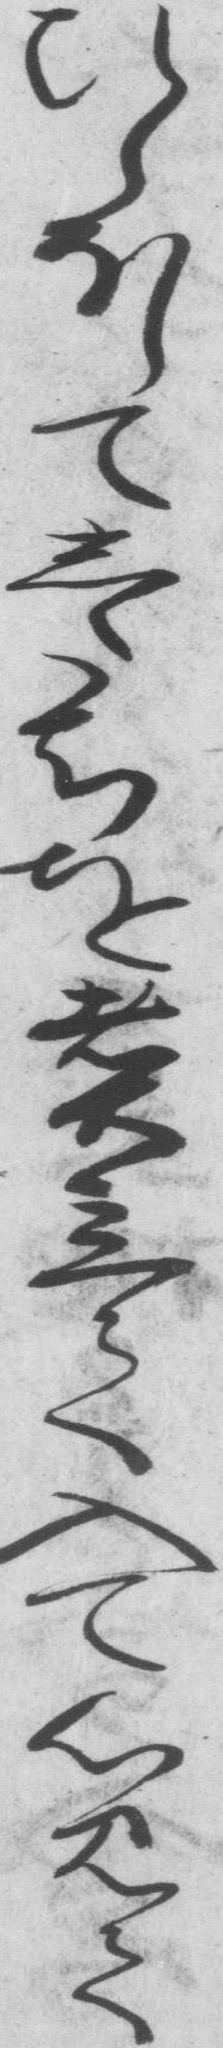ひしほしてしたちを煮立て入て心見て
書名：料理次第
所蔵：大阪府立大学学術情報センター 国文学研究資料館
